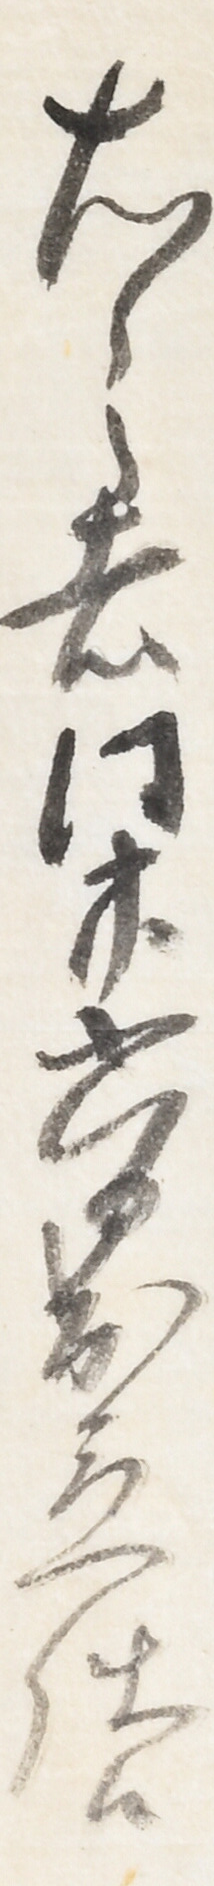右之者同廿六日出立仕候
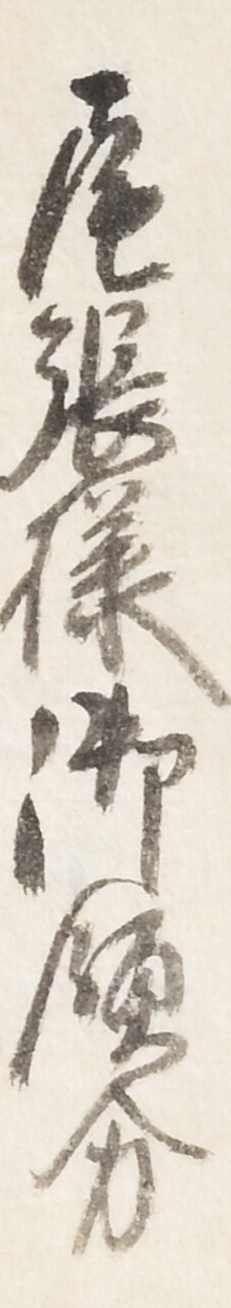尾張様御領分
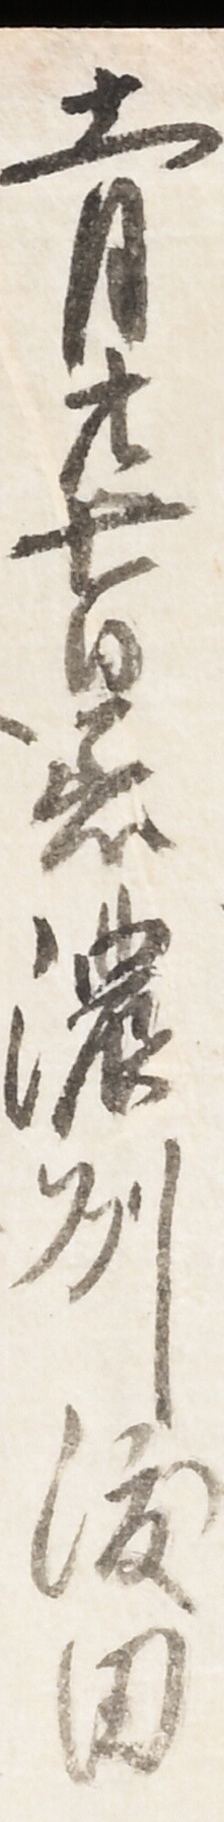十一月廿七日着濃州渡田
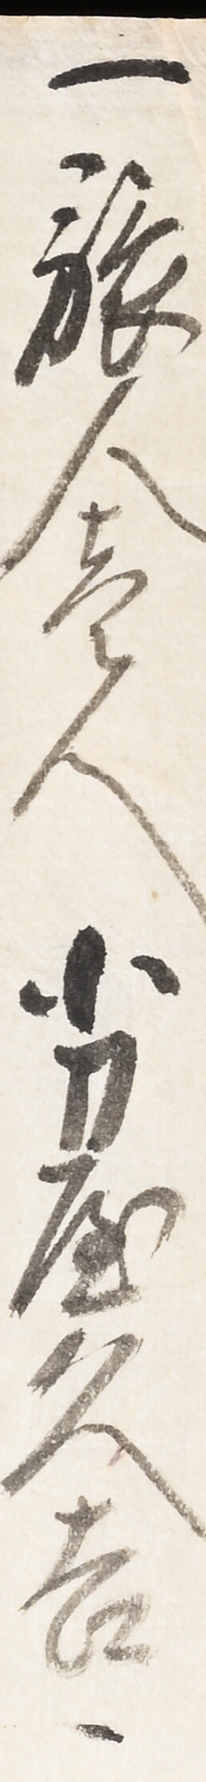一旅人壱人小刀屋久吉・
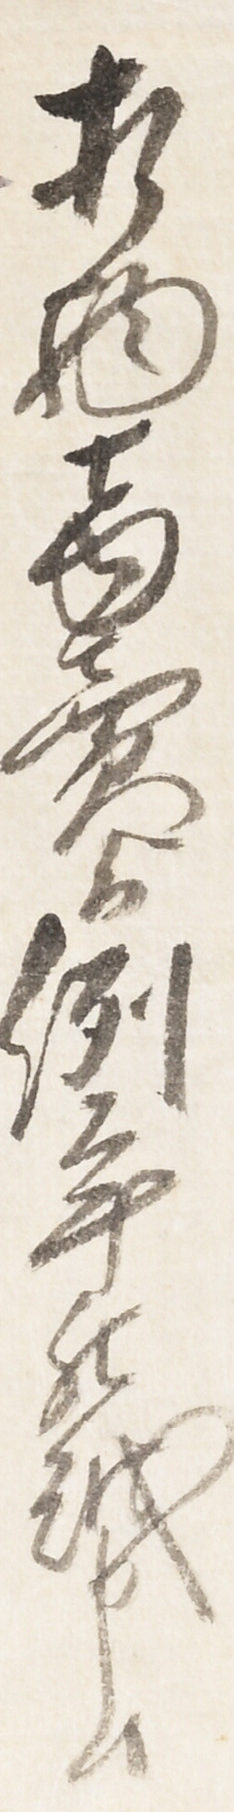打物商売ニ而例年罷越申候
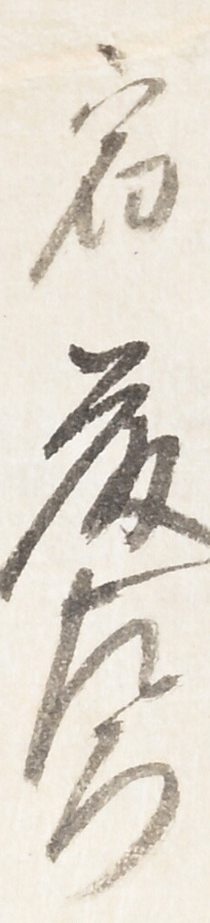宿籐左衛門
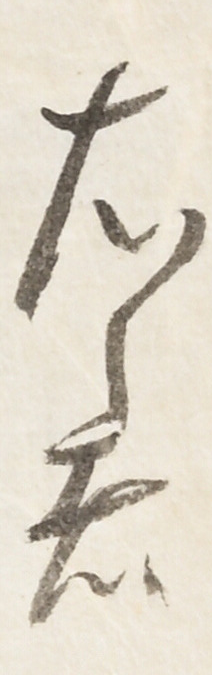右之者
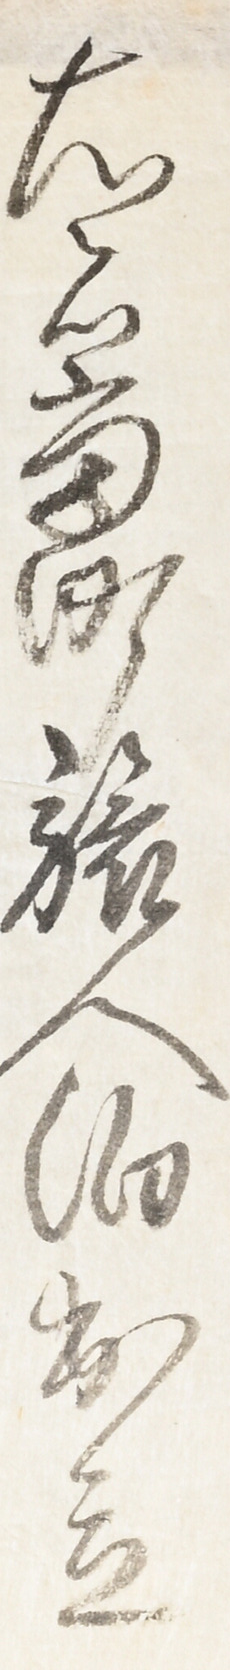右者当町旅人泊出立
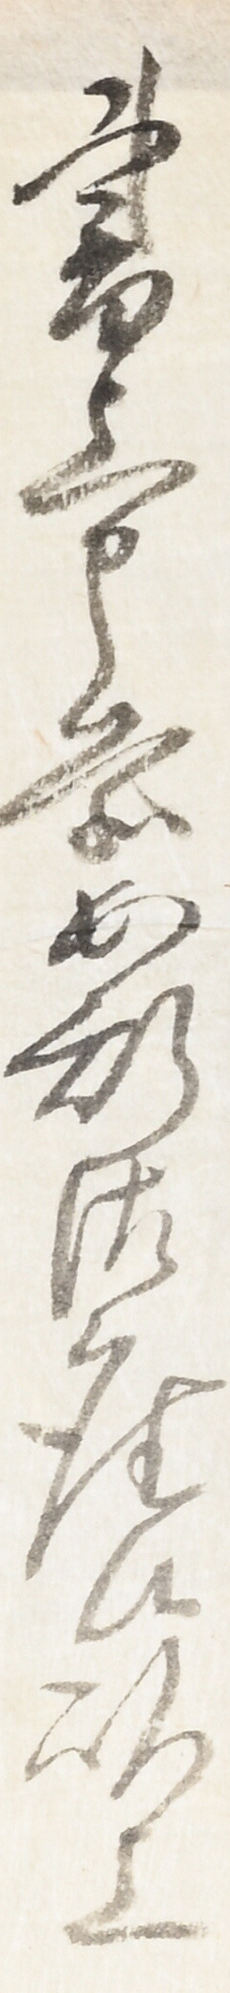書上申候所如斯御座候以上
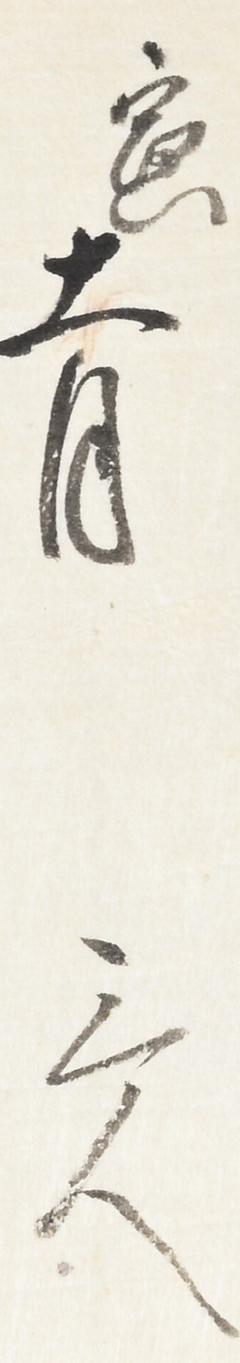十一月三人
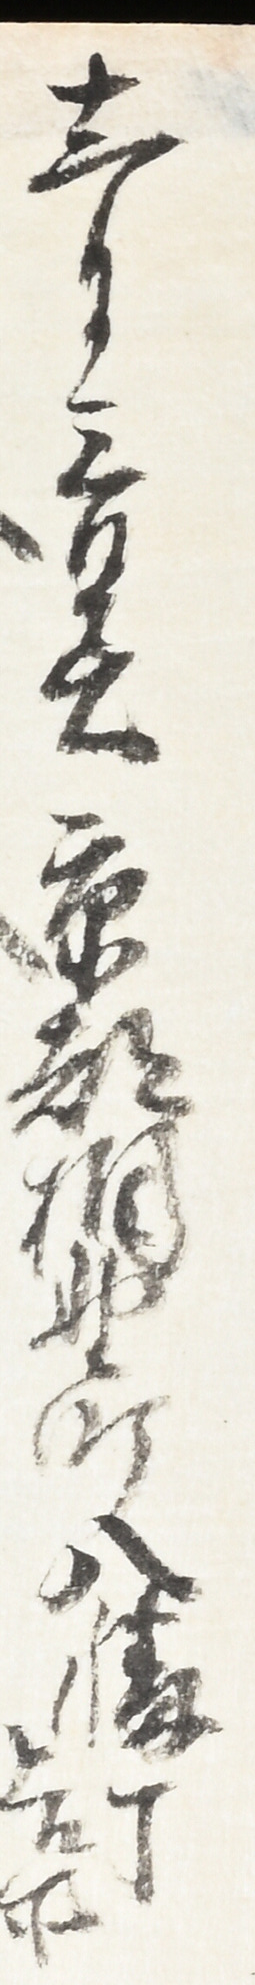十二月三日着京都相野町八幡丁
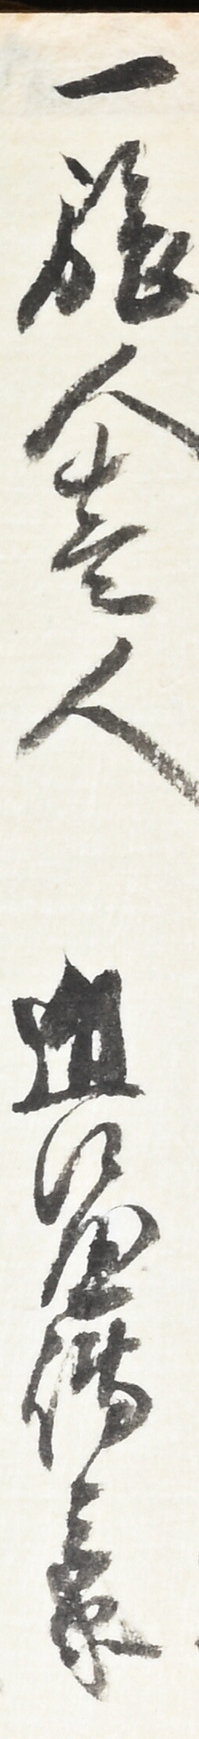一旅人壱人近江屋伝兵衛
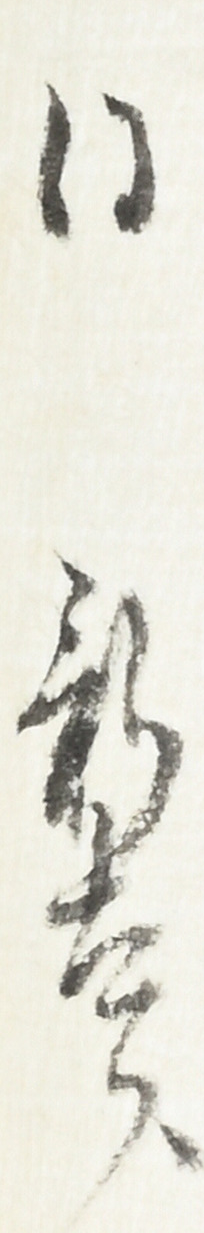同新太郎
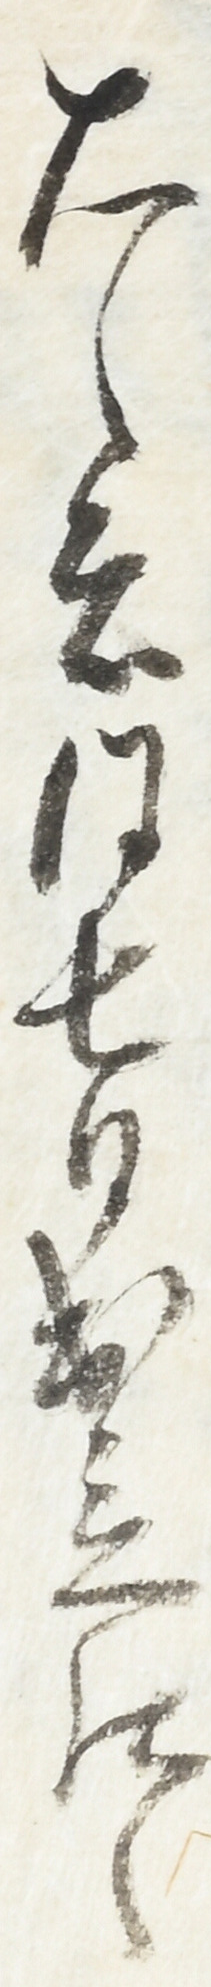右之者同廿六日出立仕候

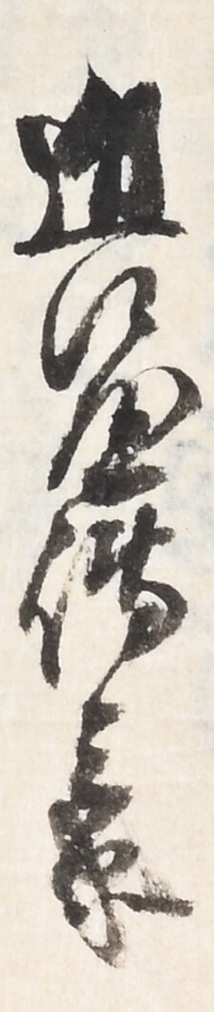一近江屋太兵衛
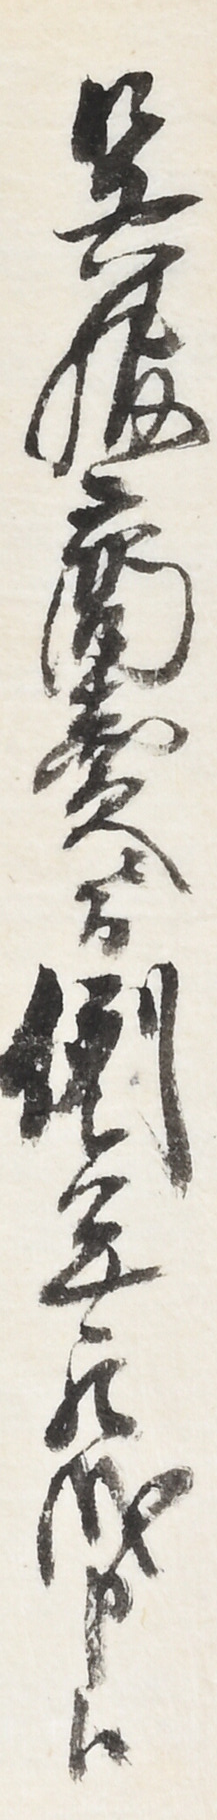呉服商売ニ而例年罷越申候
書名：旅人泊控帳
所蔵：伊那市立高遠町図書館・合同会社AMANE
